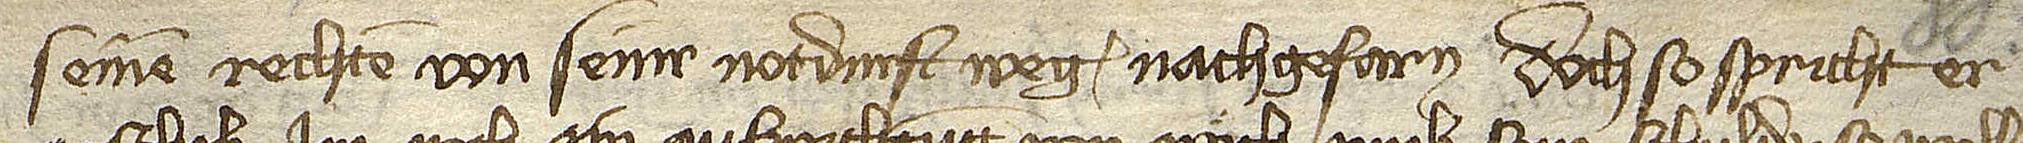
ſeine* rechte* von ſeinr notdurft weg* nachgefarn / Doch ſo ſpricht er
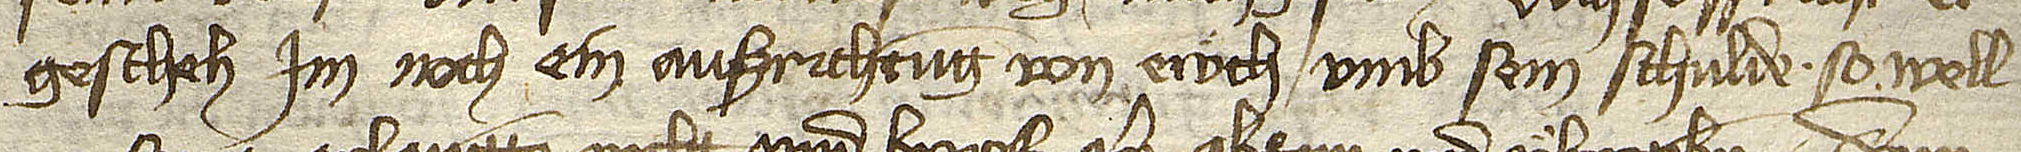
geſcheh Im noch ein auſʒrichtu*g von eẅch vmb ſein ſchulde . ſo well
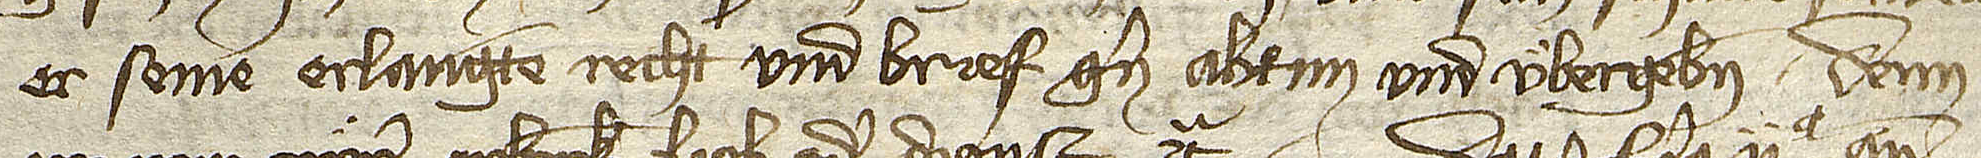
er ſeine erlangte* recht vnd brief g*n abtun vnd v̈bergebn* / Denn
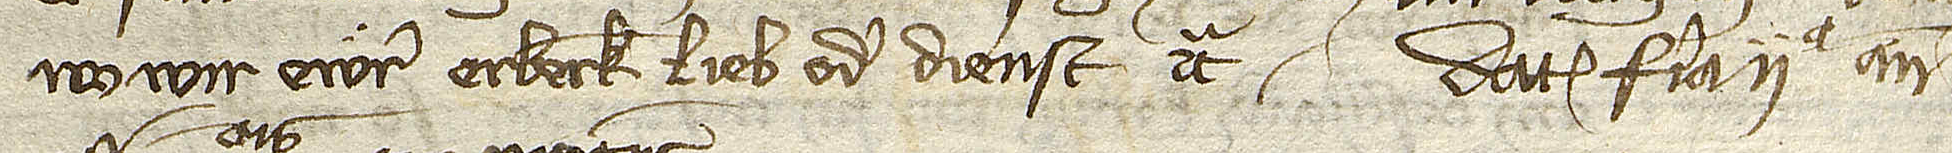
wo wir eẅr* erberk* lieb od* dienſt ec* / Dat* fi*a ii* an*
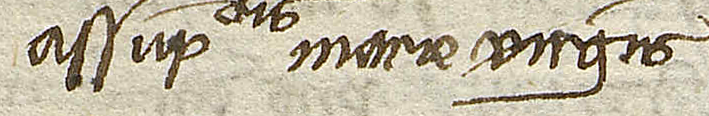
aſſu*p* marie virg*is
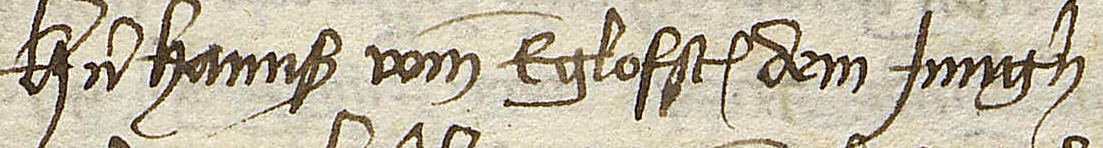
Hn* hannſ* vom* Eglofſt* dem Iung*n
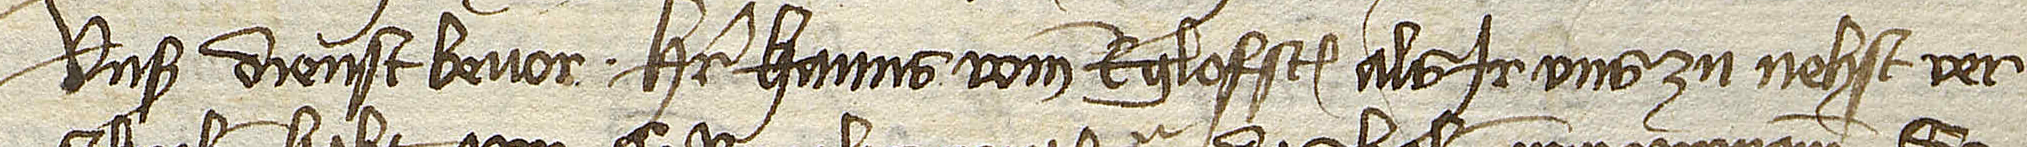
Vnſ* dienſt beuor . Hr* hanns vom* Eglofſt* als Ir vns ʒu nehſt ver
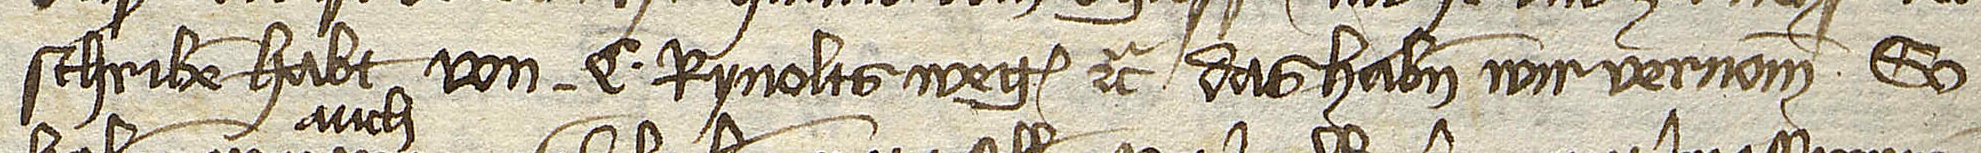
ſchribe* habt von . C . Rynolts weg* ec* das habn* wir vernom* . So
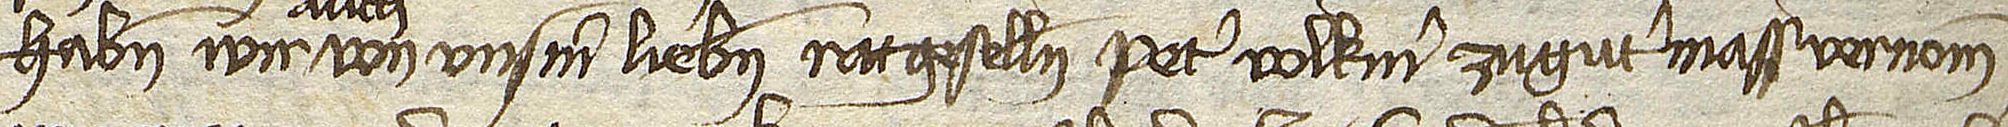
habn* wir von vnſm* liebn* ratgeſelln* Pet* volkm* ʒugut* maſſ vernom*
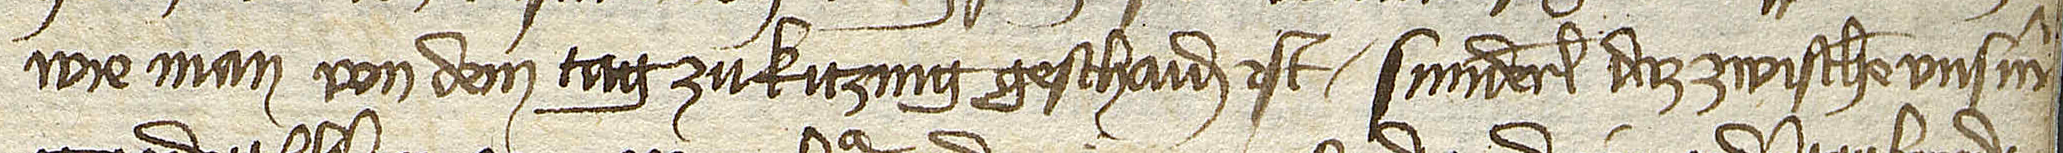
wie man von dem tag ʒu kicʒing geſchaid* iſt / ſunderl* daʒ ʒwiſche* vnſm*
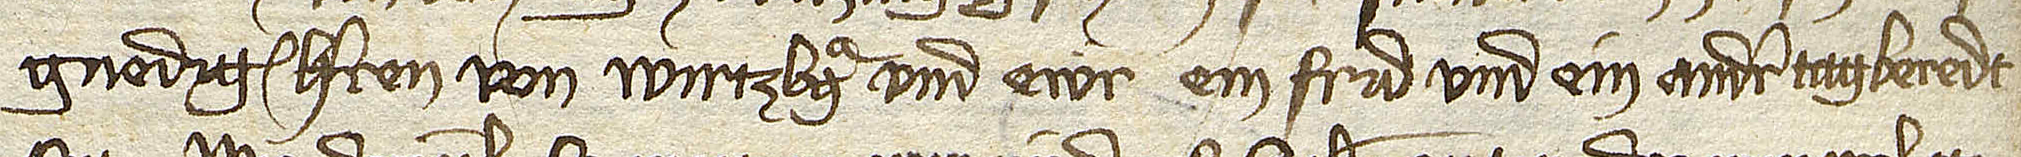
gnedig* h*ren von wircʒb*g vnd eẅr ein frid vnd ein andr* tag beredt
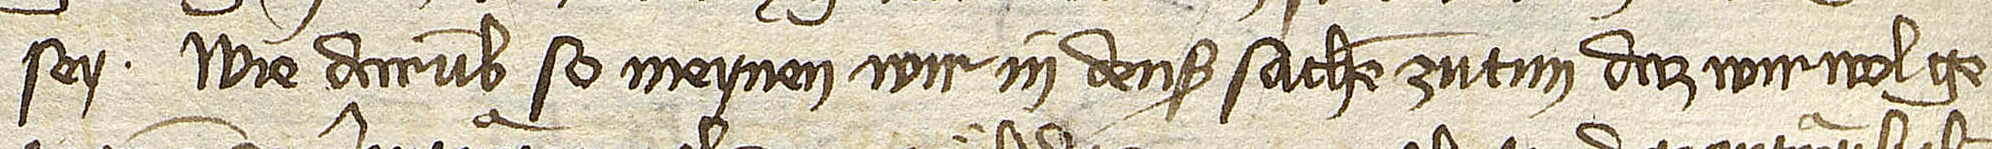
ſey . Wie darub* ſo meynen wir in denſ* ſache* ʒutun daʒ wir wol ge
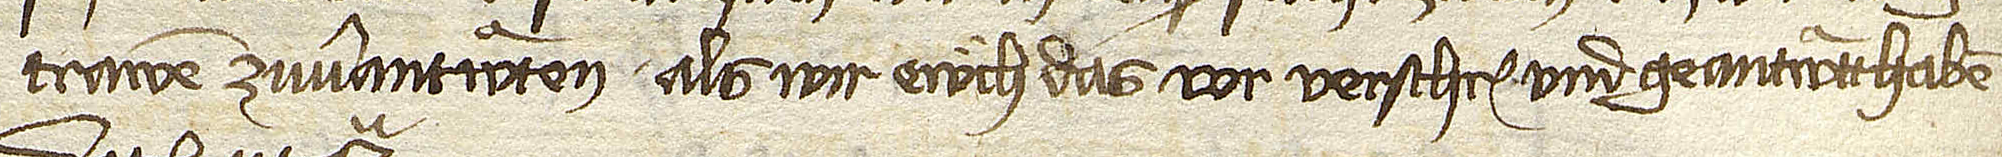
trawe* ʒuu*antw*ten / als wir eẅch das vor verſchr* vnd geantw*tt habe*
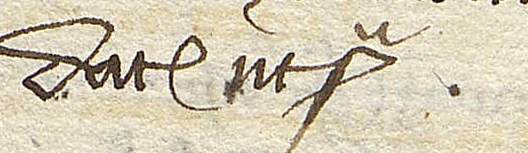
Dat* ut ſ* .
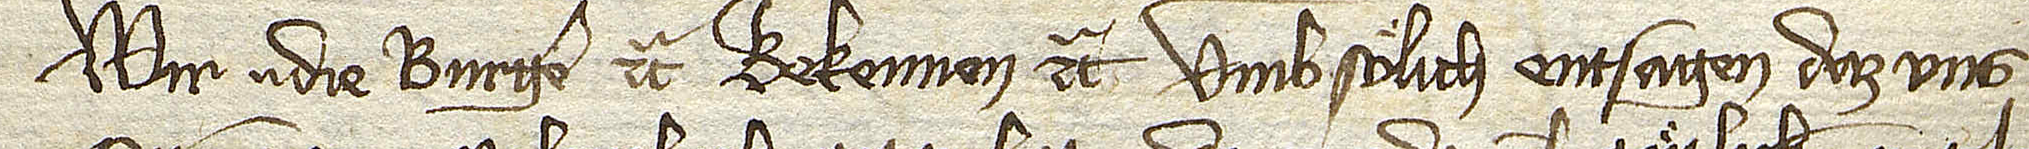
Wir ~ die Burge* ec* Bekennen ec* Vmb ſölich entſagen daʒ vns
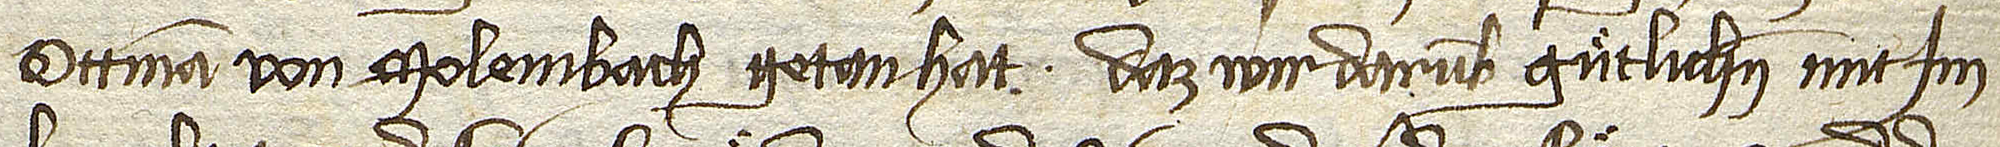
Ottma* von Molembach getan hat . daʒ wir darub* gütlichn* mit Im
